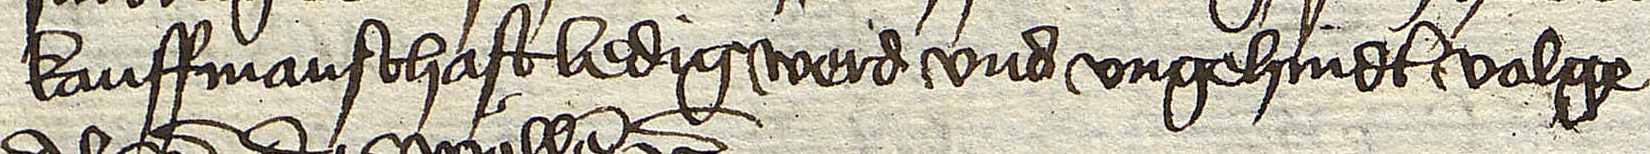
kauffmanſchaft ledig werd vnd vngehindt* volge
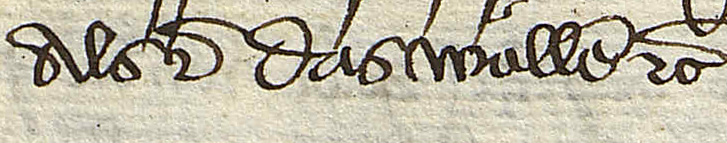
Als ec* Das wölle* ec*
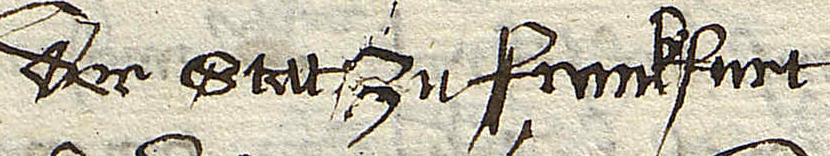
Der Stat ʒu Frankfurt
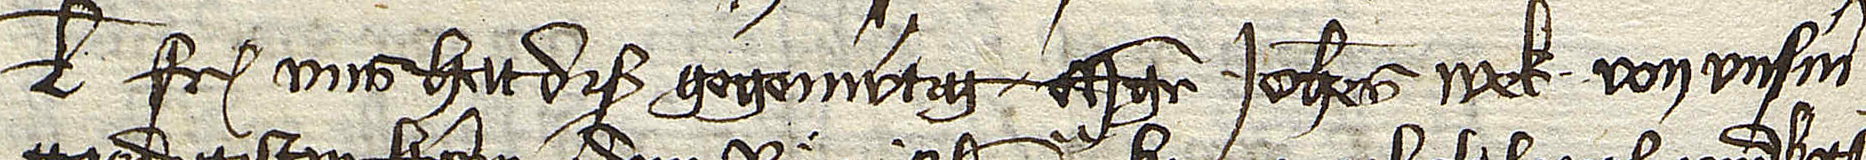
L* fr* vns hat diſ* gegenw*tig / Mgr* Ioh*es wek . von vnſm*
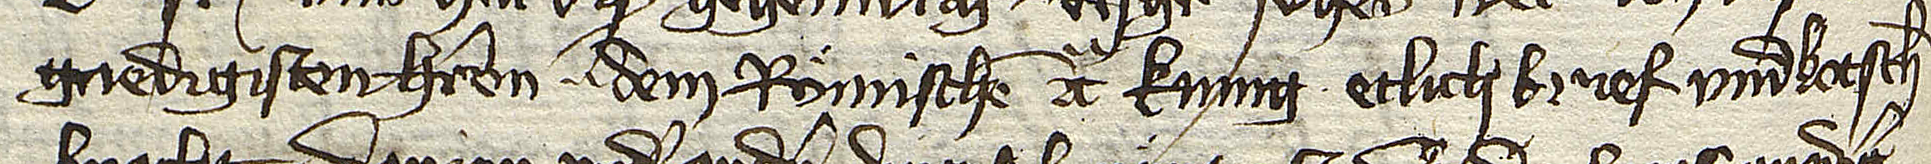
gnedigiſten h*ren ~ dem Römiſche* ec* kunig . etlich brief vnd botſch*
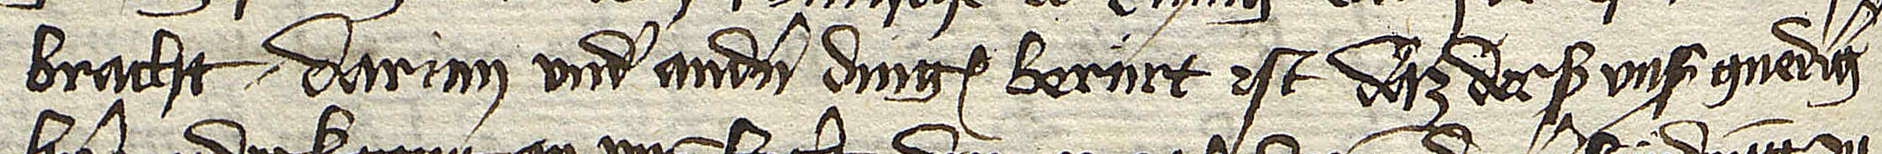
bracht / darinn vnd* andn* ding* berürt iſt Daʒ derſ* vnſ* gnedig*
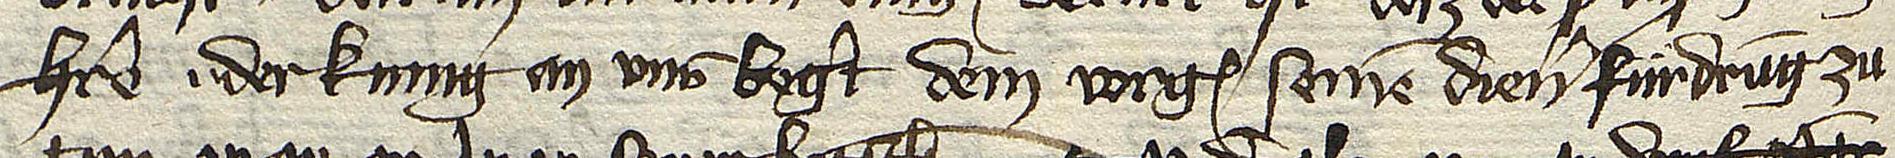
h*re ~ der kunig an vns beg*t dem vorg* ſeine* dien* fürdru*g ʒu
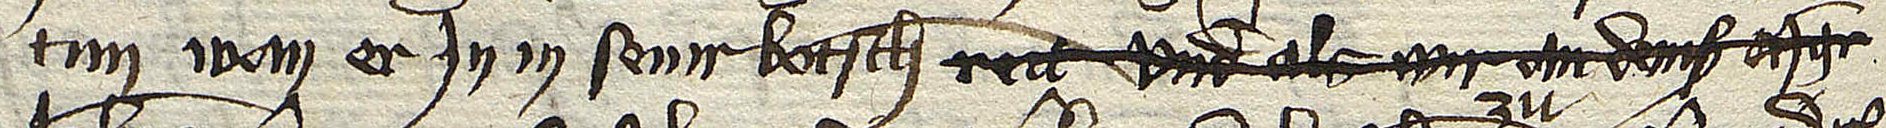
tun wan er In in ſeinr botſch* reit vnd als wir an demſ* Mgr*
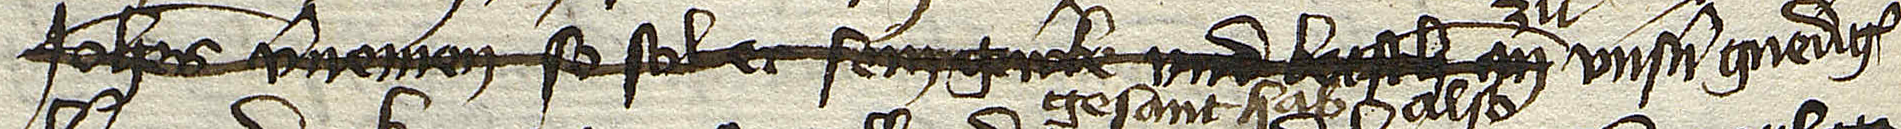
Ioh*es v*nemen ſo ſol er ſein gew*be vnd botſch* an vnſn* gnedig*
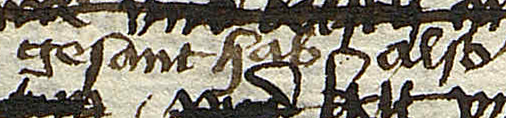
geſant hab alſo
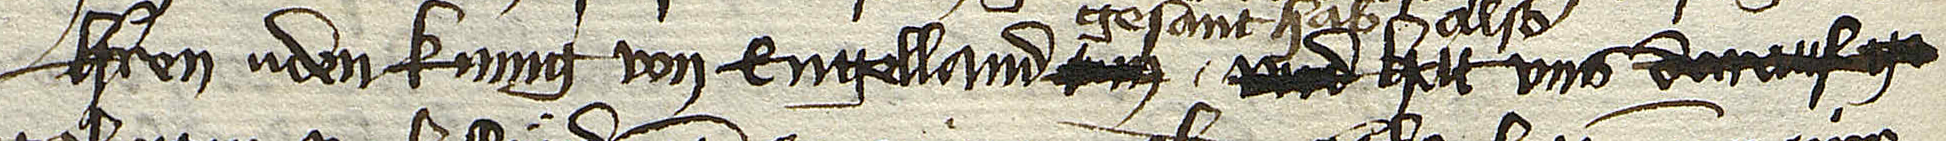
h*ren ~ den kunig von Engelland tun / vnd hat vns darauf ge
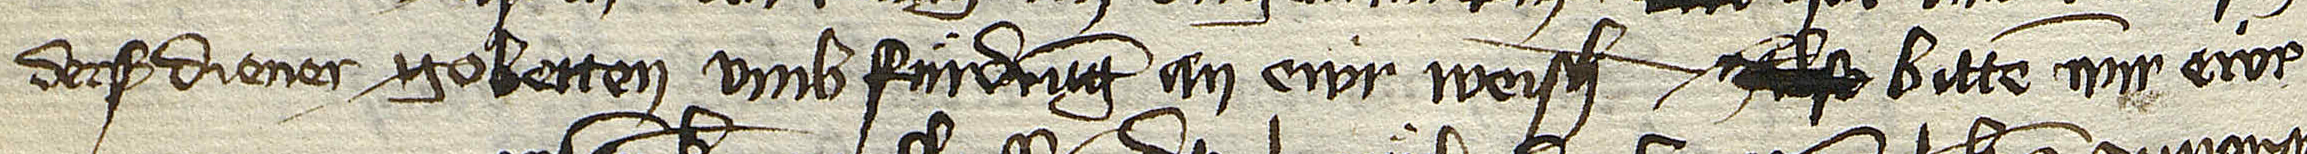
derſ* diener gebetten vmb fürdru*g an eẅr weiſh* / Alſo bitte* wir eẅr
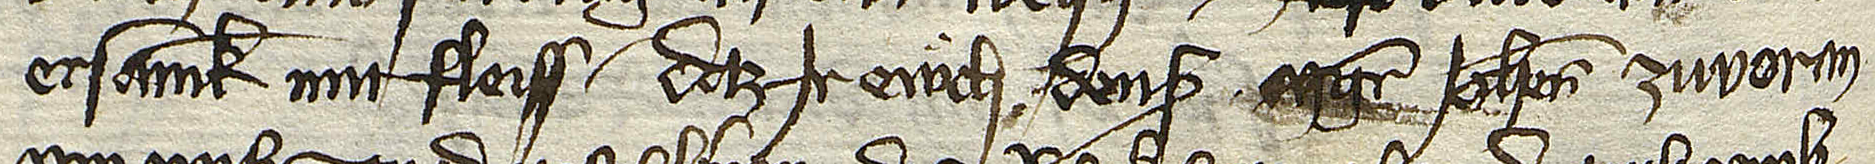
erſamk* mit fleiſſ / daʒ Ir eẅch denſ* / Mgr* Ioh*es ʒuvor an
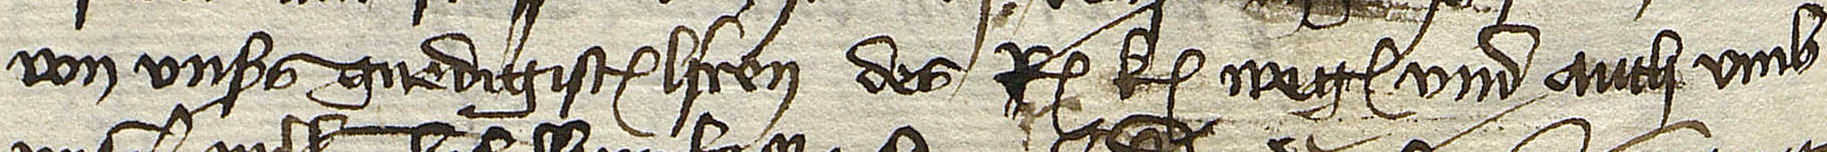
von vnſ*s gnedigiſt* h*ren des R* k* weg* vnd auch vmb
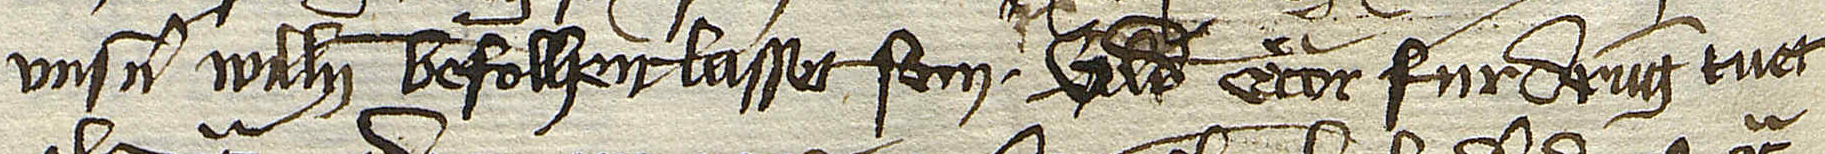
vnſn* willn* befolhen laſſet ſein / Vnd eẅr furdru*g tuet
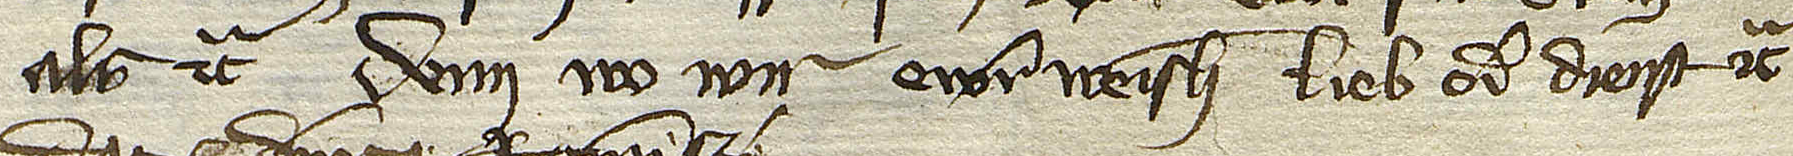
als ec* Denn wo wir ewr* weiſh* lieb od* dienſt ec*
